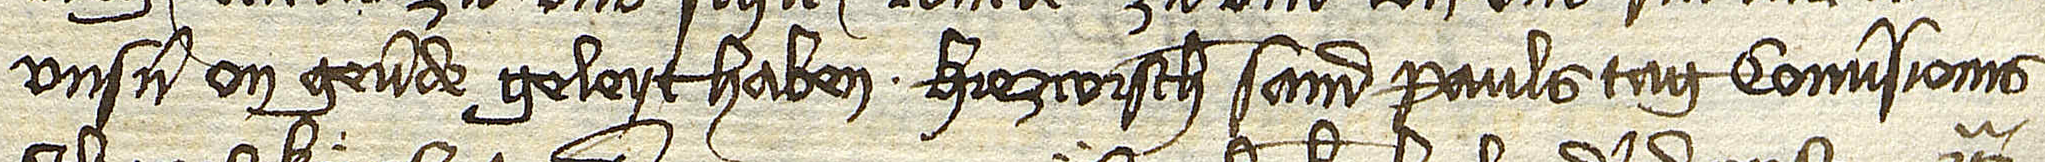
vnſ*n on geu*de geleyt haben . hieʒwiſch* ſand Pauls tag Conu*ſionis
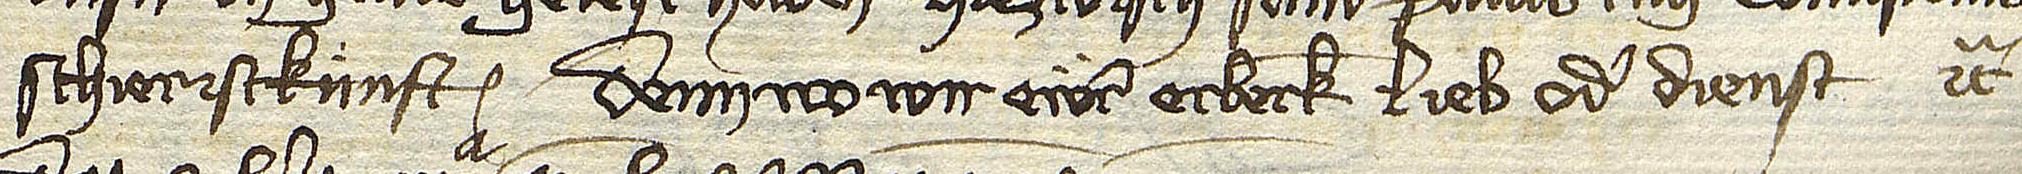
ſchieriſtkünft* / Denn wo wir eẅr* erberk* lieb od* dienſt ec*
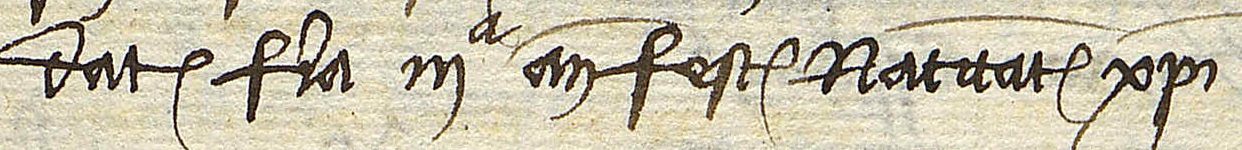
Dat* f*ia iii* an* feſt* Natitat* xpi*
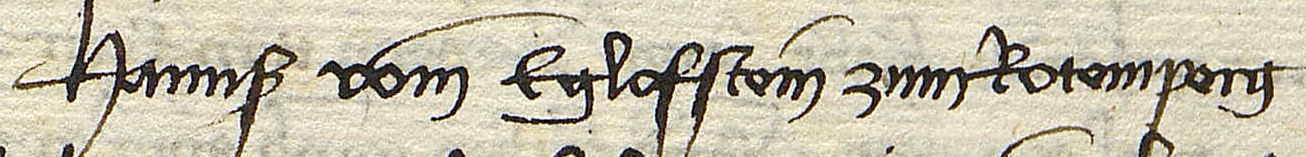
Hannſ* vom* Eglofſtein ʒum Rotemperg
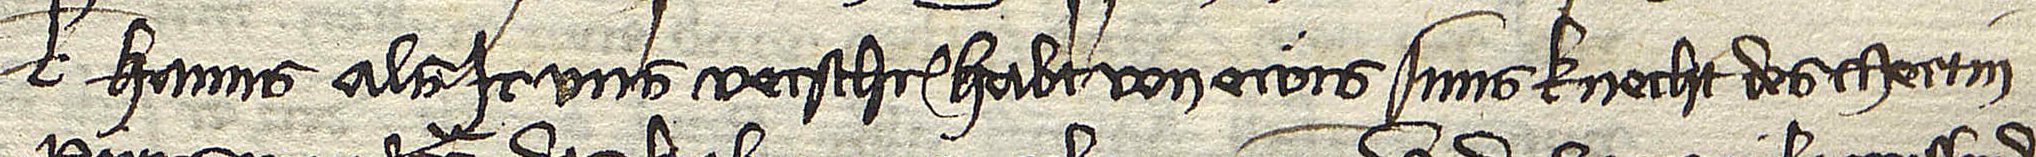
L* hanns als Ir vns verſchr* habt von eẅrs ſuns knecht des Mertin
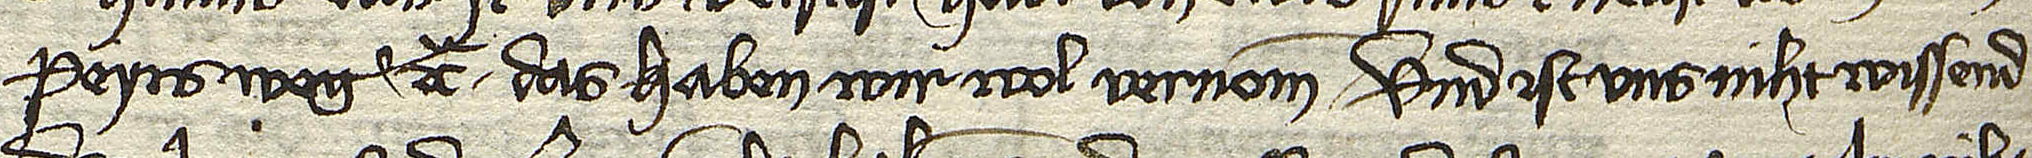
Peyrs weg* ec* . das haben wir wol vernom* / Vnd iſt vns niht wiſſend
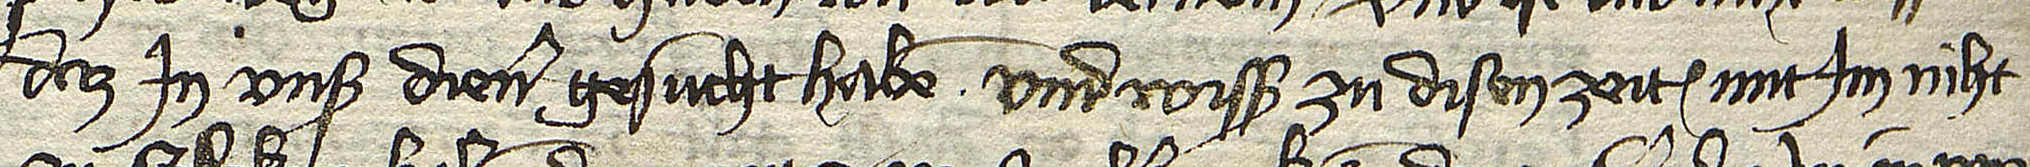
daʒ In vnſ* dien* geſucht habe* . vnd wiſſ* ʒu diſen ʒeit* mit Im niht
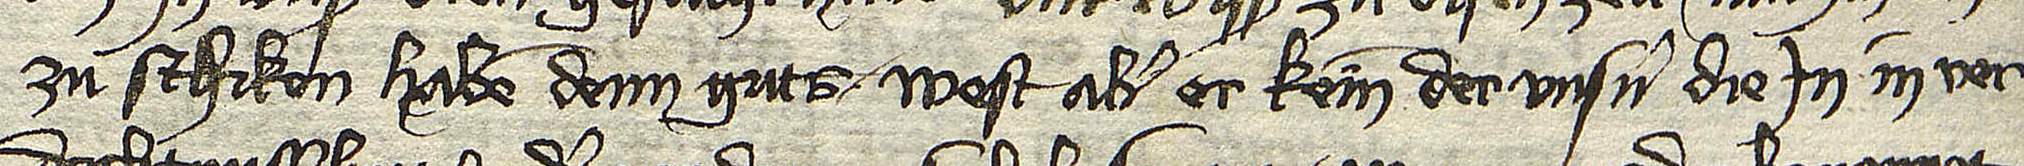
ʒu ſchiken habe* denn guts / weſt ab* er kein* der vnſ*n die In in ver
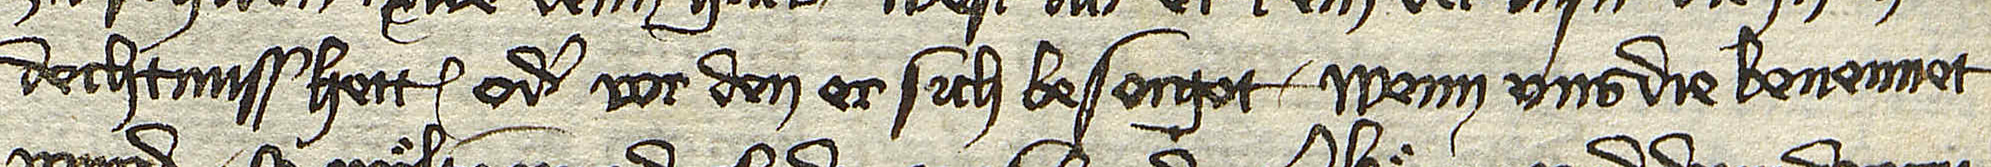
dechtnuſſ hett* od* vor den er ſich beſorget / wenn vns die benennet
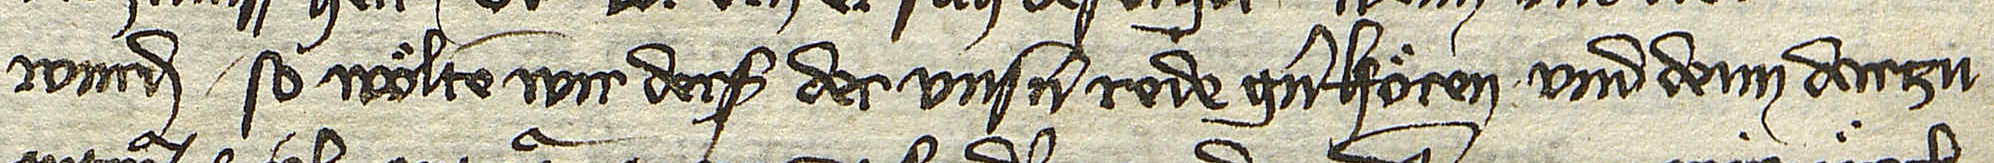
wurd* / ſo wölte* wir derſ* der vnſ*n rede g*n hören . vnd denn darcʒu
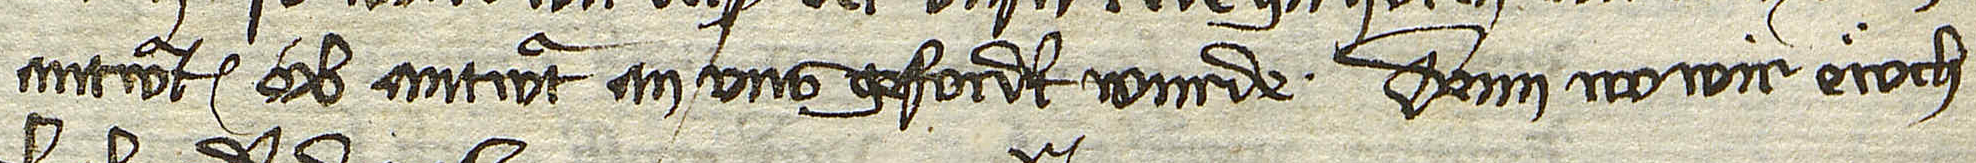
antw*t Ob antw*t an vns geford*t wurde . Denn wo wir eẅch
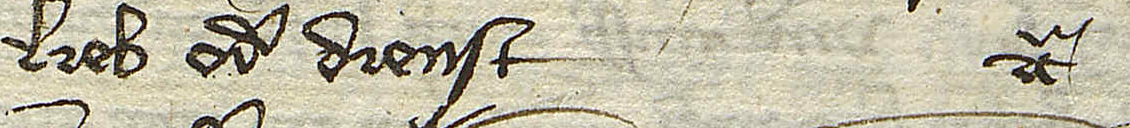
lieb od* dienst ec*
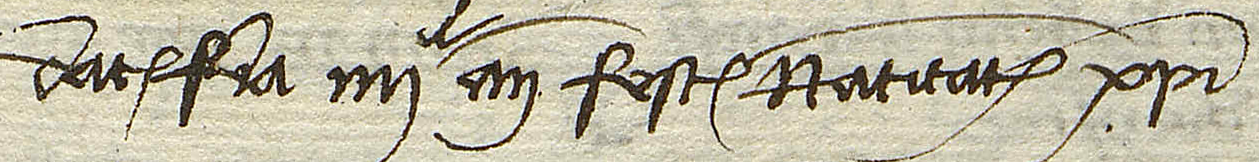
Dat f*ia iiii* an* feſt* Natitat* xpi*
